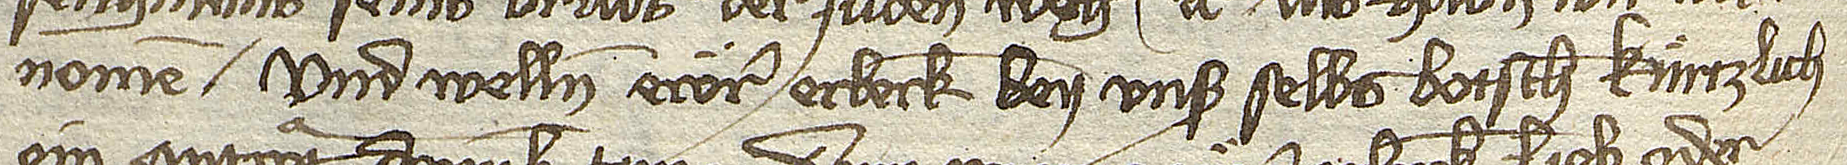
nome* / Vnd welln* ewr* erberk* bey vnſ* ſelbs botſch* kürcʒlich
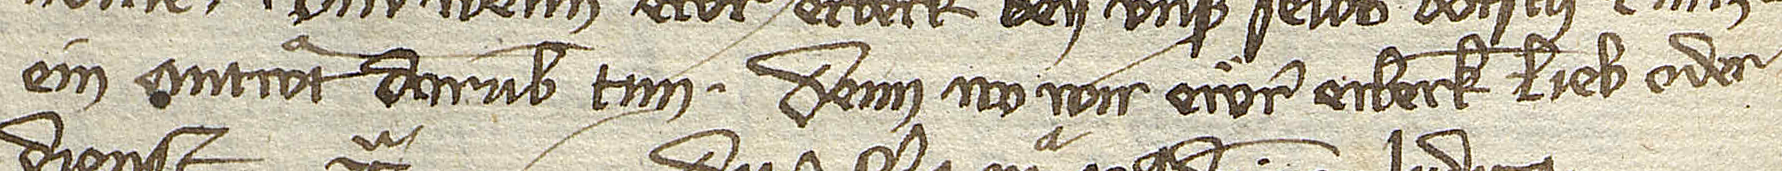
ein antw*t daru*b tun . Denn wo wir ewr* erberk* lieb oder
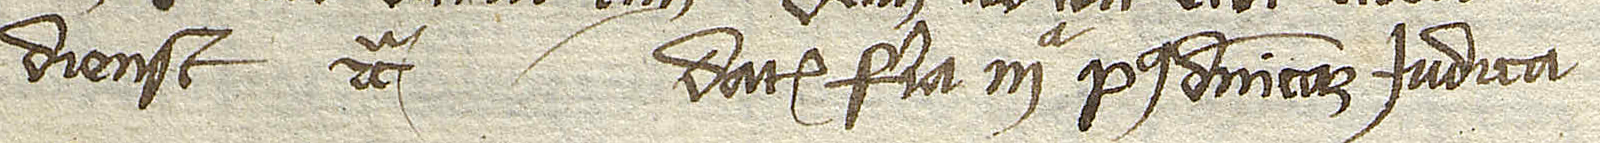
dienſt ec* / Dat* f*ia iii* p* dnica* Iudica
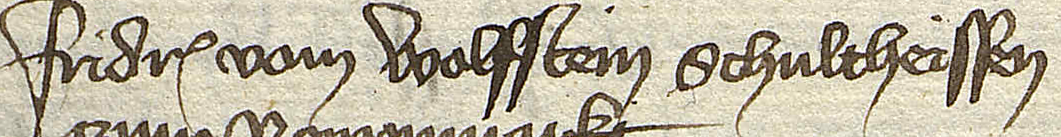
Fridr* vom wolfſten Schultheiſſen
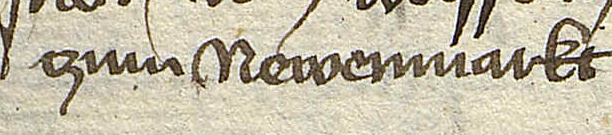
cʒum Newenmarkt
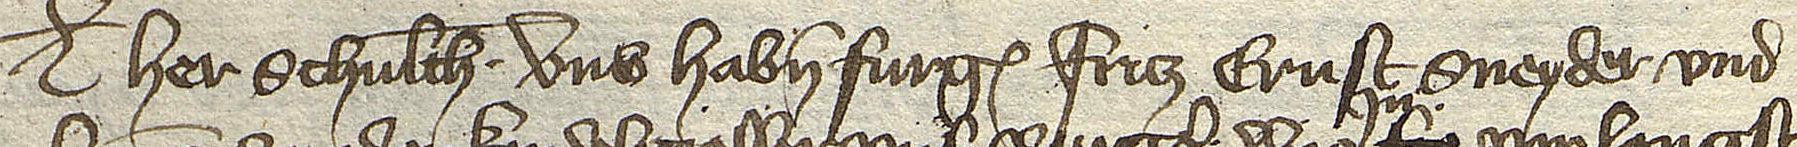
L* her Schulth* . Vns habn* furg* Fricʒ Ernſt Sneyder vnd
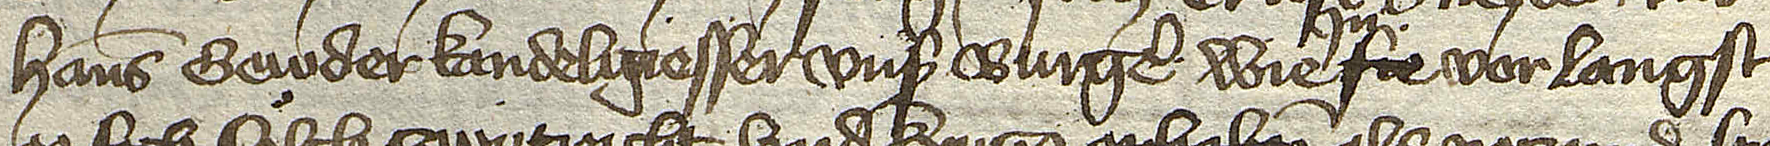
hans* Gewder kandelgieſſer vnſ* Burge* wie ſie vor langſt
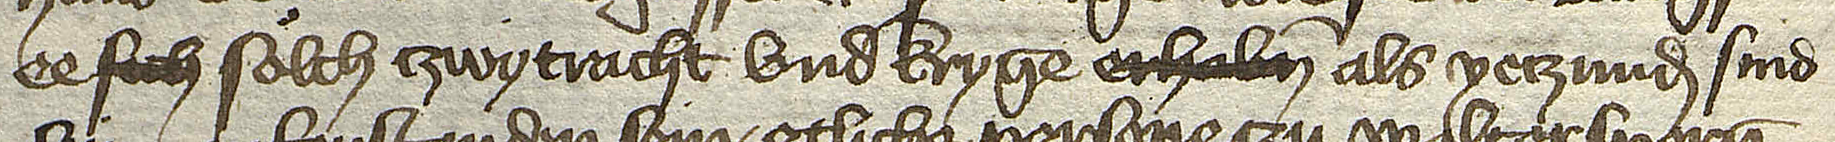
ee ſich ſölch cʒwytracht vnd kryge erhabn* als yecʒund* ſind
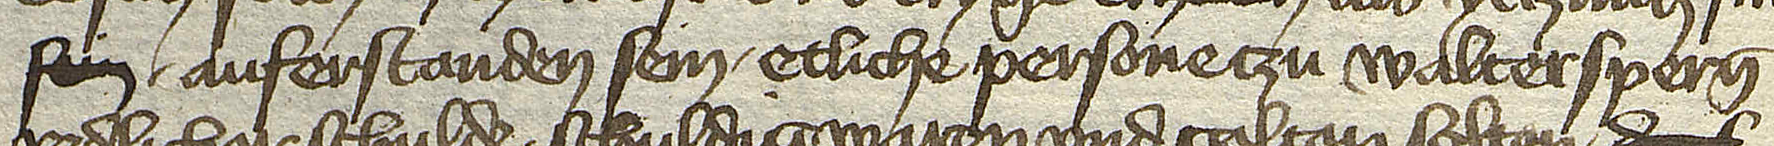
ſein / auferſtanden ſein / etliche perſone cʒu walterſperg
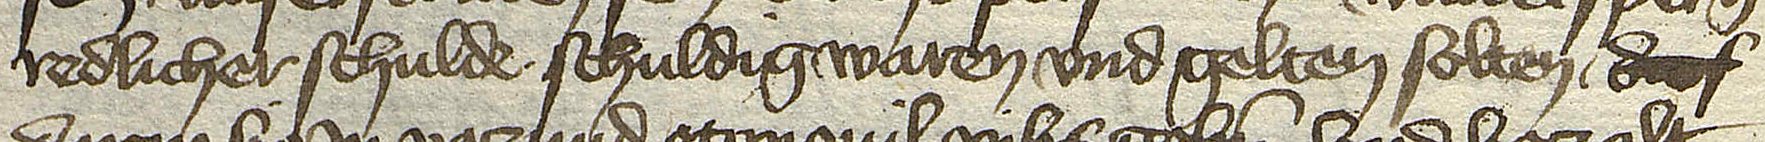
redlicher ſchulde . ſchuldig waren vnd gelten ſolten dieſ
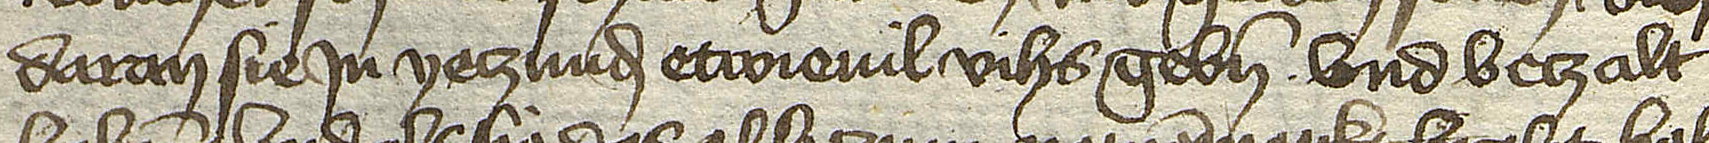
daran ſie In yecʒund* etwieuil vihs gebn* . vnd becʒalt
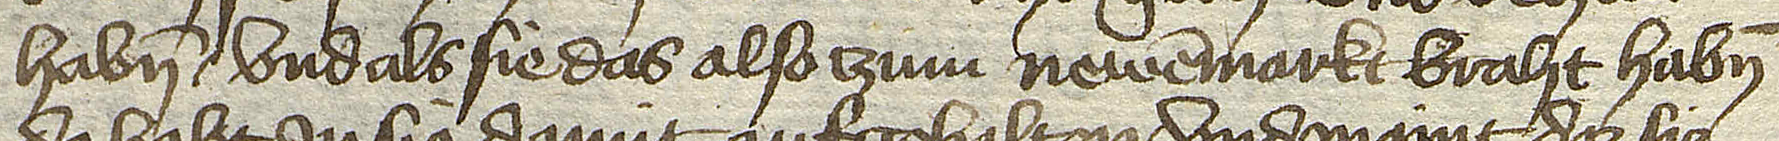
habn* / vnd als ſie das alſo cʒum Newe*markt braht habn*
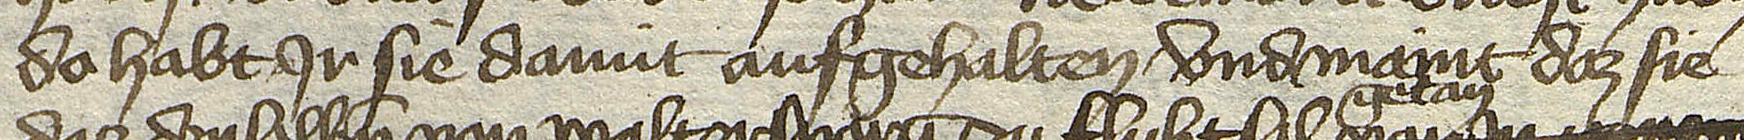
do habt Ir ſie damit aufgehalten / vnd maint daʒ ſie
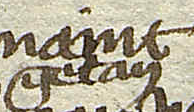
getan
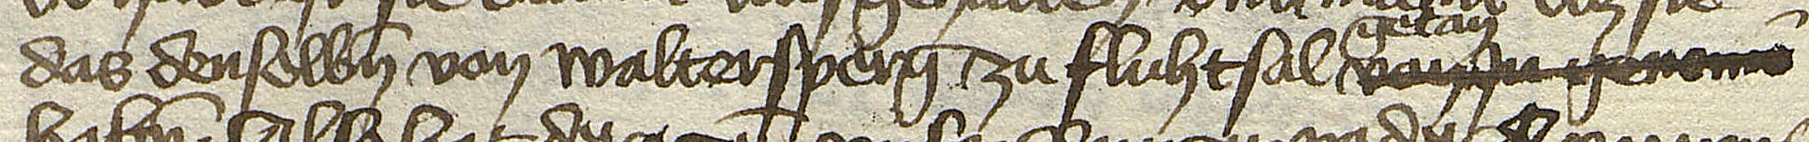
das denſelbn* von walterſperg cʒu fluhtſal von In genome*
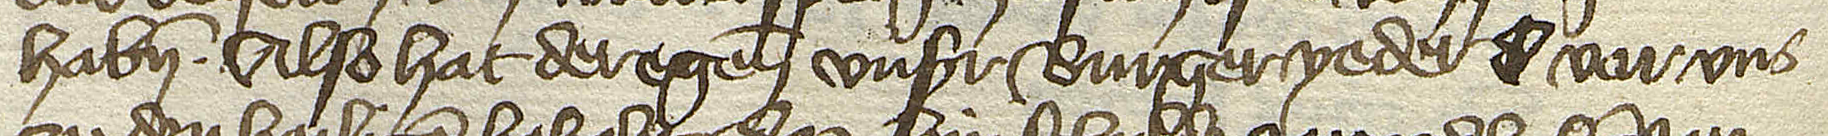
habn* . Alſo hat der egen* vnſ*r Burger yeder d vor vns
